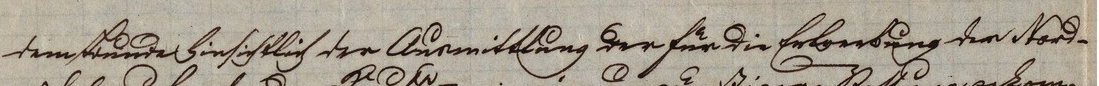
dem Bunde hinsichtlich der Ausmittlung der für die Erwerbung der Nord-
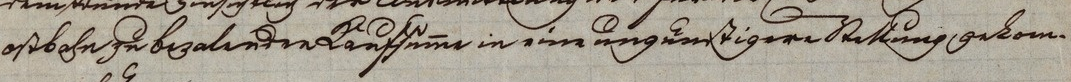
ostbahn zu bezalenden Kaufsumme in eine ungünstigere Stellung gekom-
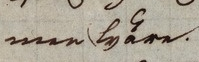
men wäre.
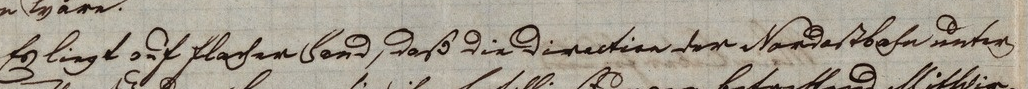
Es liegt auf flacher Hand, daß die Direction der Nordostbahn unter
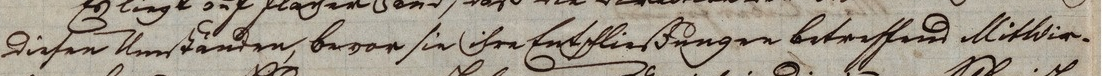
diesen Umständen, bevor sie ihre Entschließungen betreffend Mitwir-
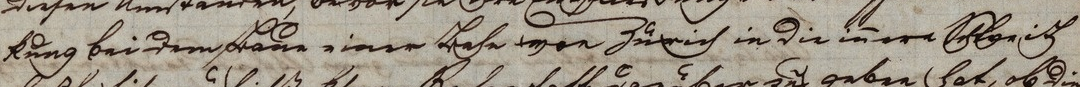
kung bei dem Baue einer Bahn von Zürich in die innere Schweitz
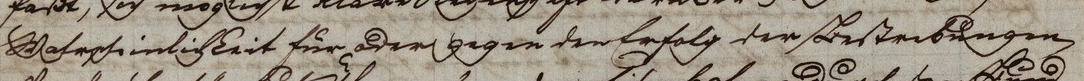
Wahrscheinlichkeit für oder gegen den Erfolg der Bestrebungen
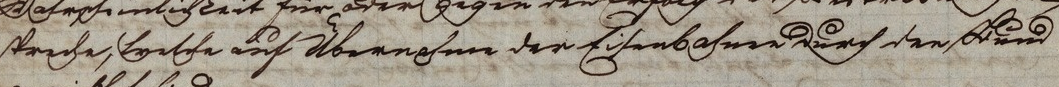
spreche, welche auf Übernahme der Eisenbahnen durch den Bund
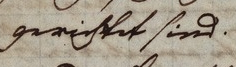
gerichtet sind.
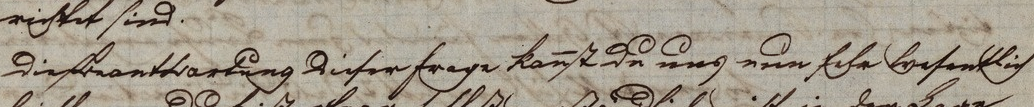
Die Beantwortung dieser Frage kannst Du uns nun sehr wesentlich
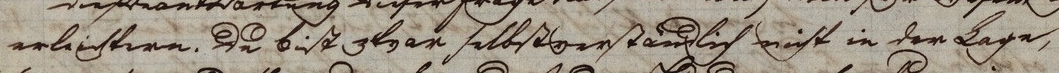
erleichtern. Du bist zwar selbstverständlich nicht in der Lage,
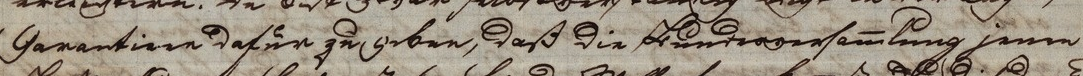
Garantieen dafür zu geben, daß die Bundesversammlung jenen
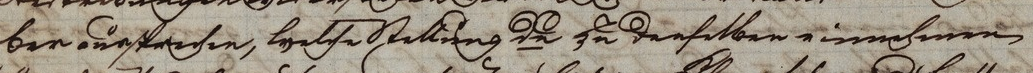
ber aussprechen, welche Stellung Du zu denselben einnehmen
